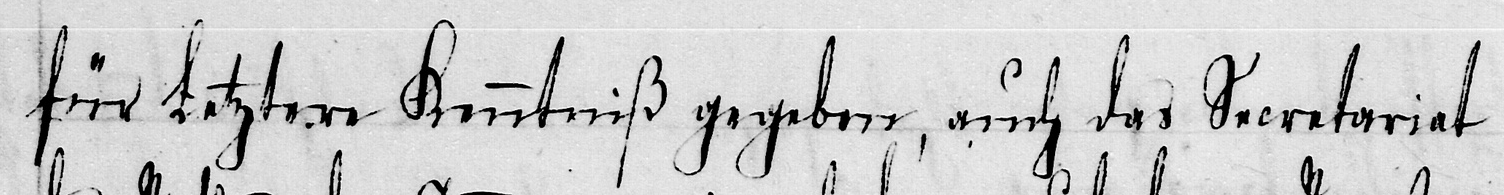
für Letztere Kenntniß gegeben, auch das Secretariat
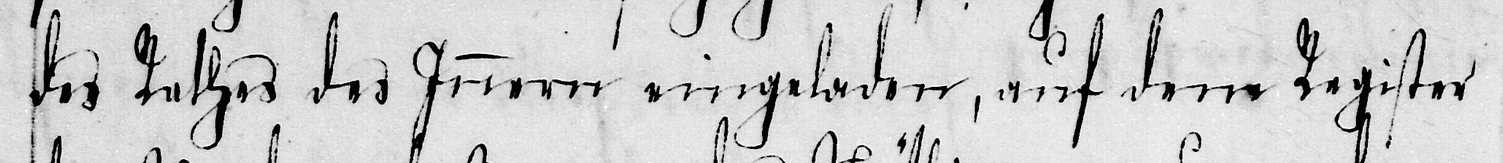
des Rathes des Innern eingeladen, auf dem Register
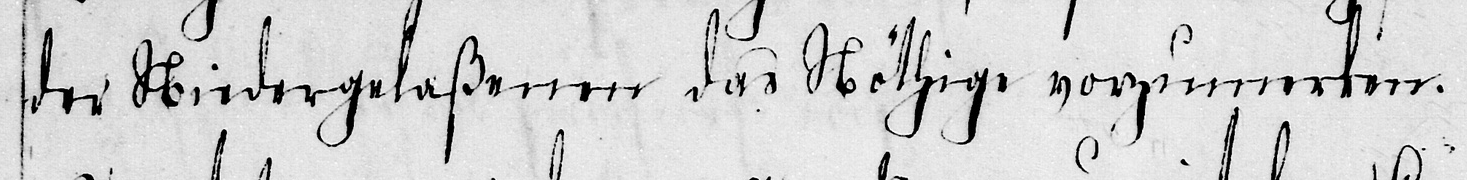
der Niedergelaßenen das Nöthige vorzumerken.
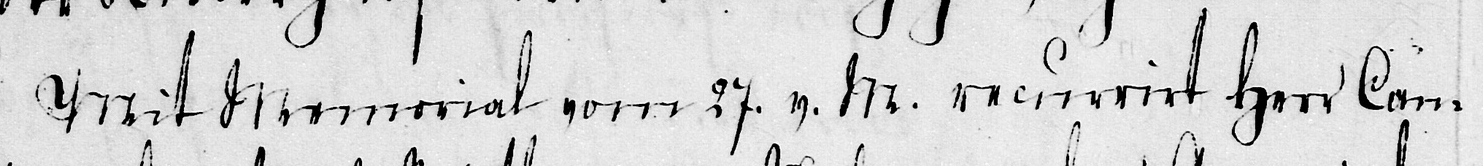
Mit Memorial vom 27. v. M. recurrirt Herr Can¬
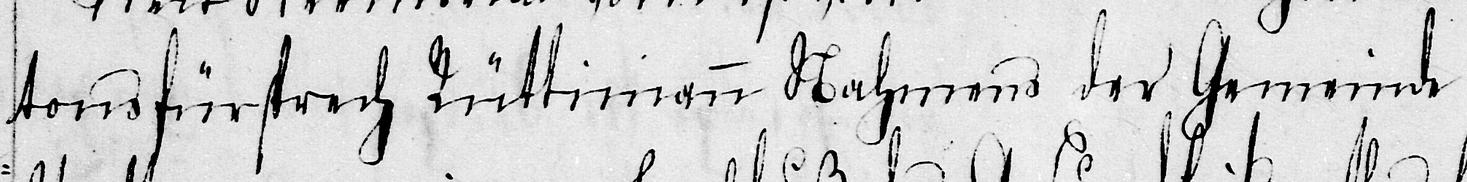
tonsfürsprech Rüttimann Nahmens der Gemeinde
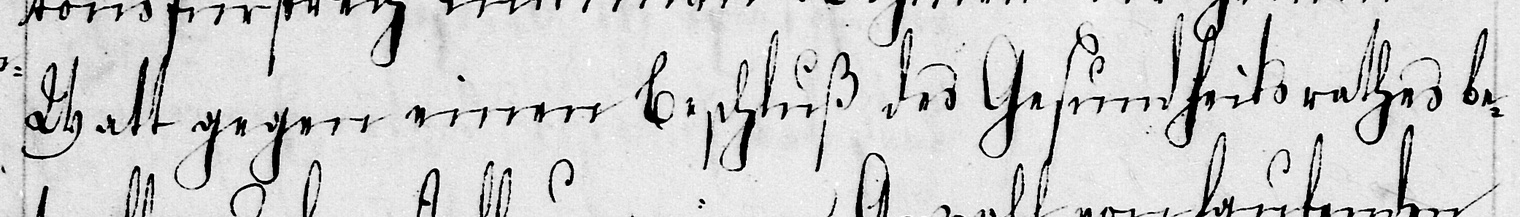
Watt gegen einen Beschluß des Gesundheitsrathes be¬
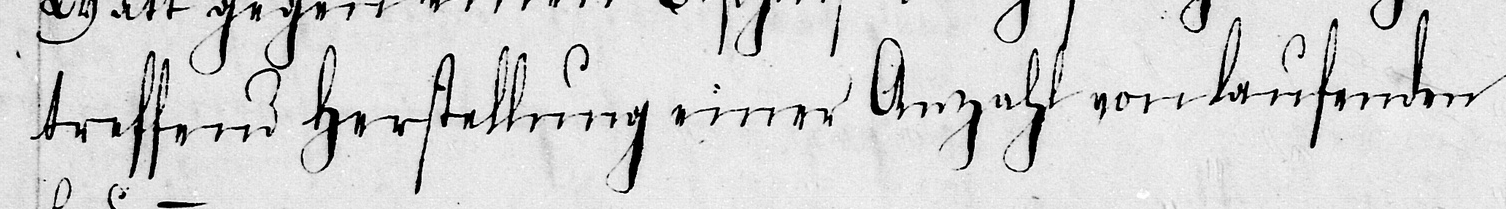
treffend Herstellung einer Anzahl von laufenden
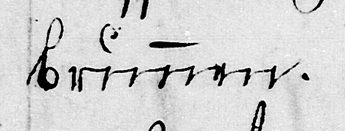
Brunnen.
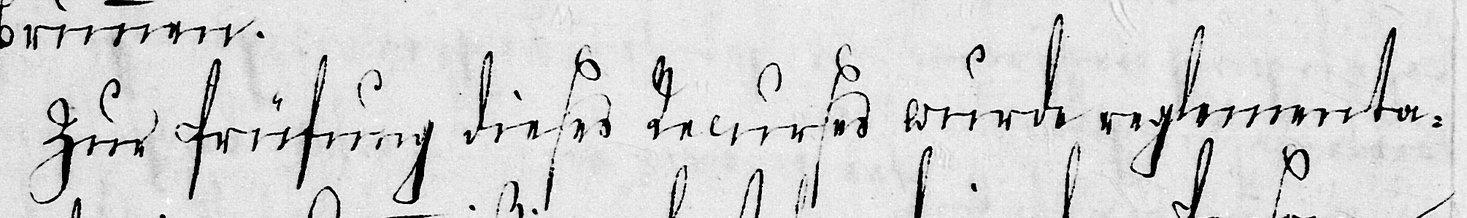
Zur Prüfung dieses Recurses wurde reglementa¬
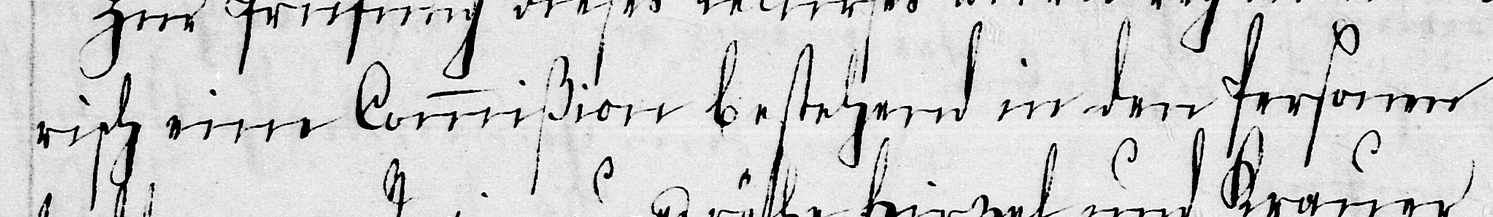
risch eine Commißion bestehend in den Personen
